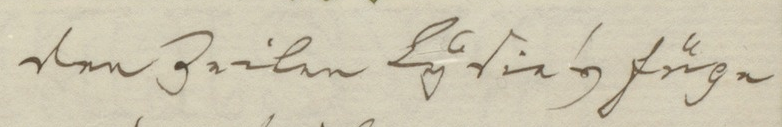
Den Zeilen Lydie's füge
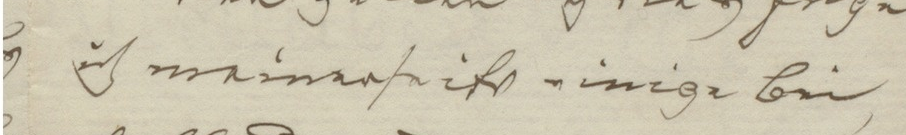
ich meinerseits einige bei,
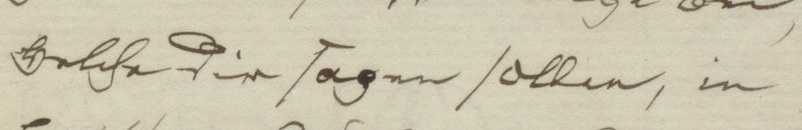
welche Dir sagen sollen, in
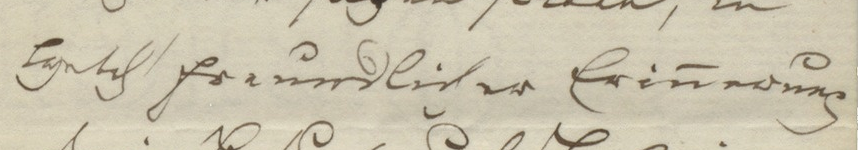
welch' freundlicher Erinnerung
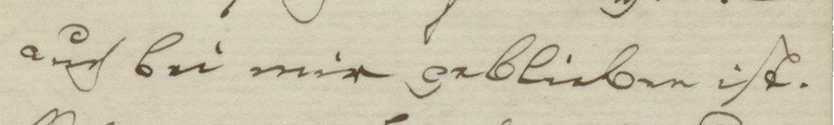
auch bei mir geblieben ist.
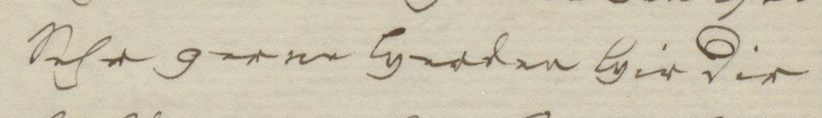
Sehr gerne werden wir Dir
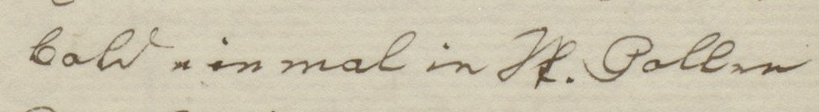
bald einmal in St. Gallen
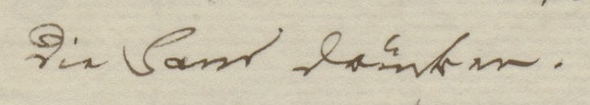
die Hand drücken.
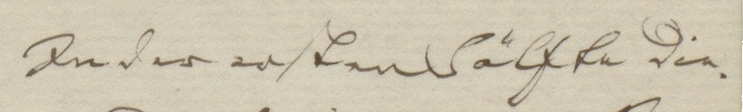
In der ersten Hälfte die-
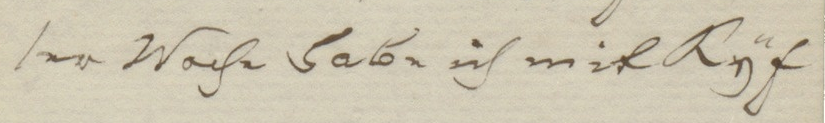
ser Woche habe ich mit Ryf
